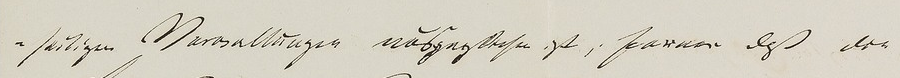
seitigen Verwaltungen ausgesprochen ist; ferner daß die
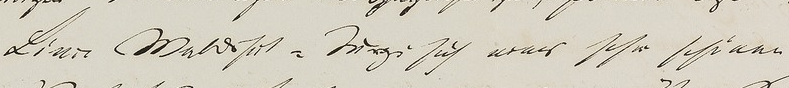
Linie Waldshut–Turgi sich eines sehr schönen
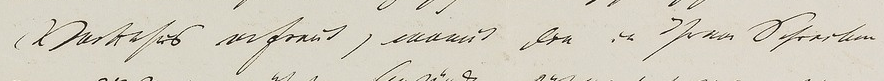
Verkehrs erfreut, womit die in Ihrem Schreiben
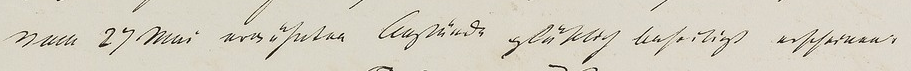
vom 27 Mai erwähnten Anstände glüklich beseitigt erscheinen.
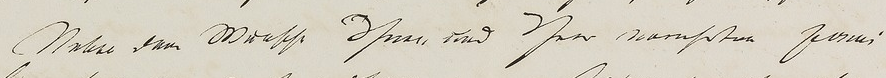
Neben dem Wunsche Ihnen und Ihrer verehrten Fami-
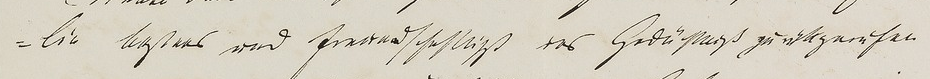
lie bestens und freundschaftlichst ins Gedächtniß zurükgerufen
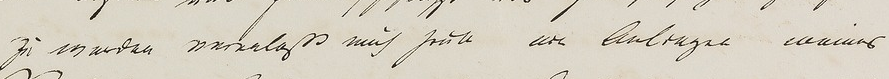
zu werden veranlaßt mich heute ein Antragen meines
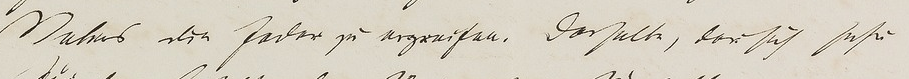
Vatersdie Feder zu ergreifen. Derselbe, der sich sehr
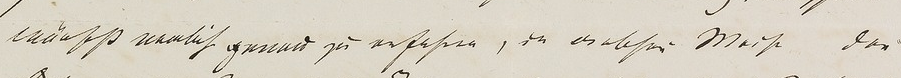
wünscht nemlich genau zu erfahren, in welcher Weise die
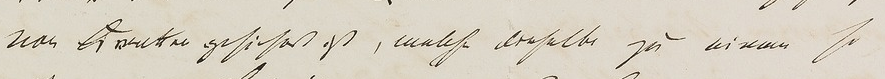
von Kranken gesichert ist, welche dieselbe zu einem so
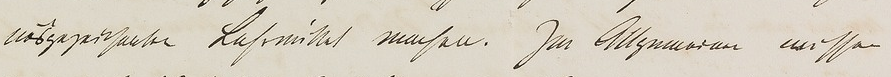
ausgezeichneten Lehrmittel machen. Im Allgemeinen wissen
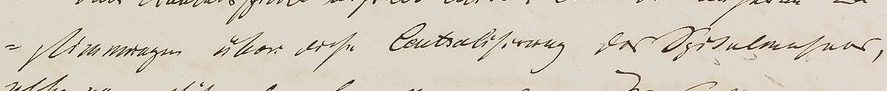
stimmungen über diese Centralisirung des Spitalwesens,
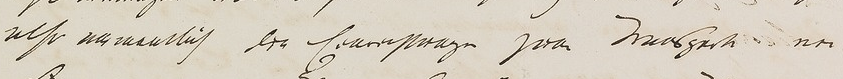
also namentlich bei Einrichtungen zum Transporte von
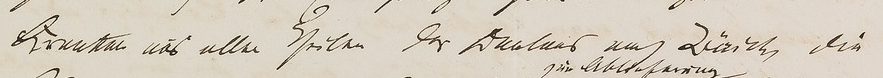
Kranken aus allen Theilen des Kantons nach Zürich, die
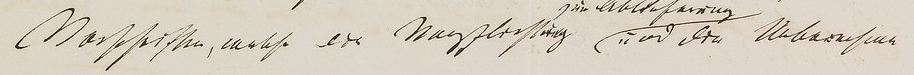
Vorschriften, welche die Verpflichtung zur Ablieferung und die Uebernahme
